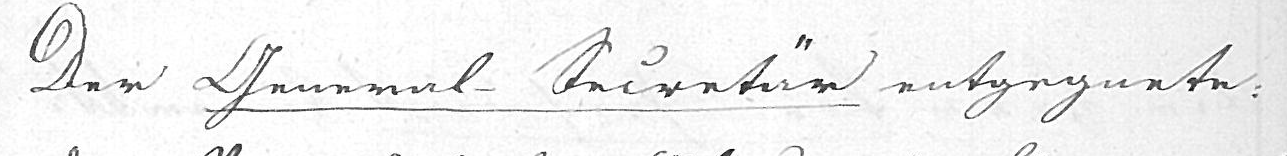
Der General-Secretär entgegnete:
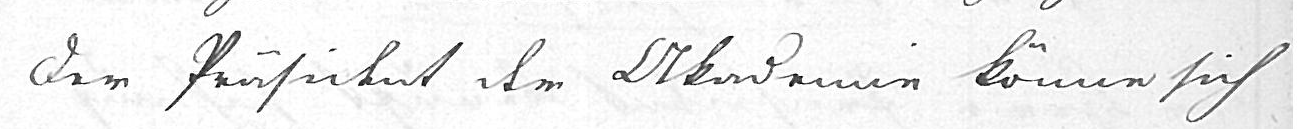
Der Präsident der Akademie könne sich
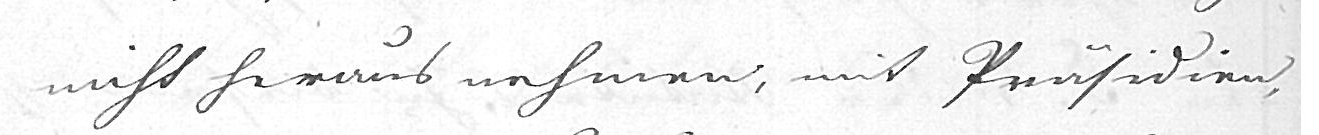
nicht herausnehmen, mit Präsidien,
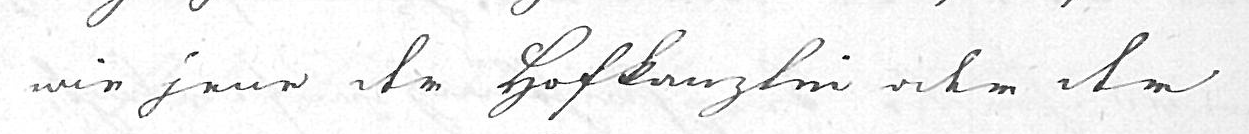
wie jener der Hofkanzlei oder der
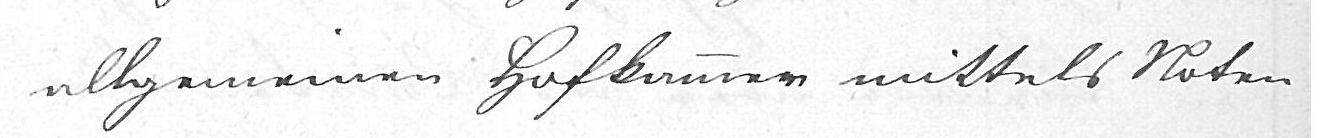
allgemeinen Hofkammer mittels Noten
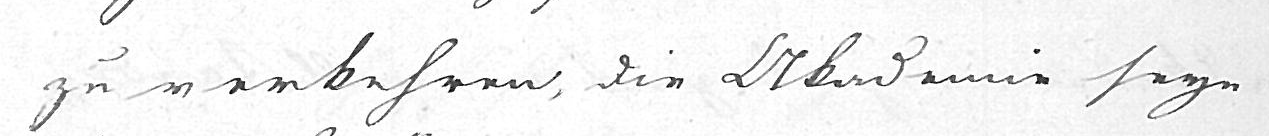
zu verkehren, die Akademie seye
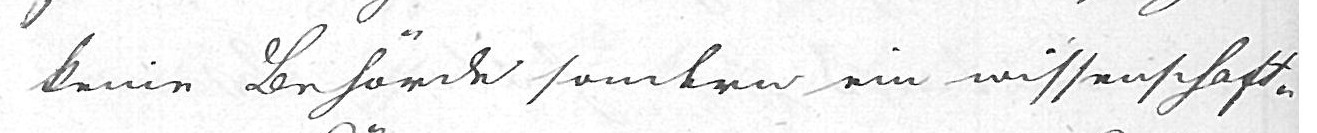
keine Behörde, sondern ein wissenschaft-
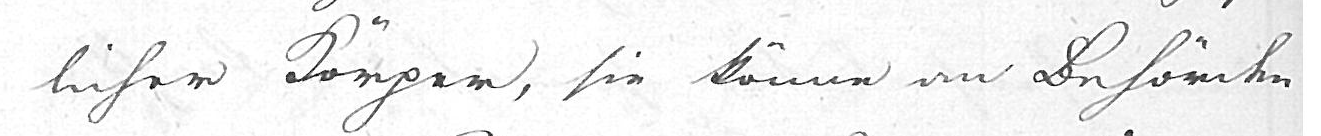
licher Körper, sie könne an Behörden
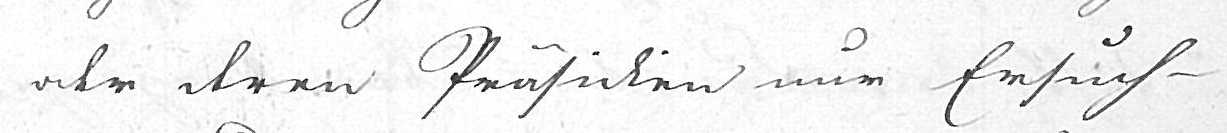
oder deren Präsidien nur Ersuche
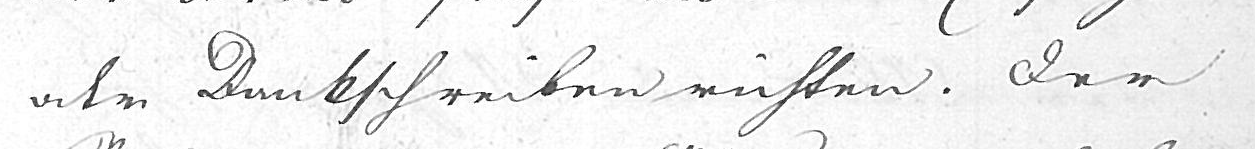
oder Dankschreiben richten. Der
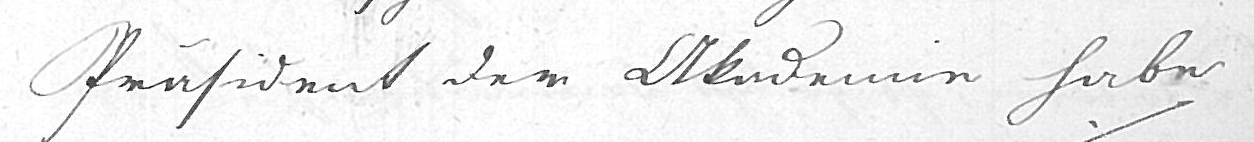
Präsident der Akademie habe
